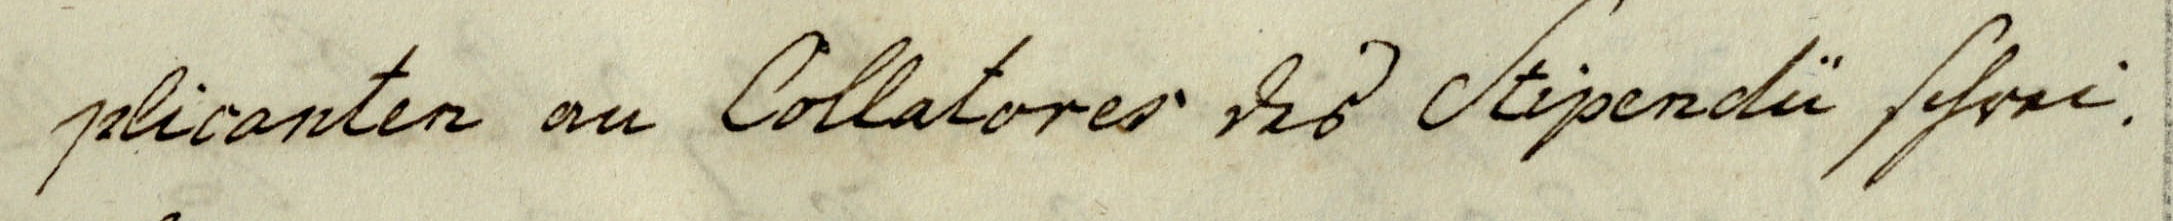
plicanten an Collatores des Stipendii schrei¬
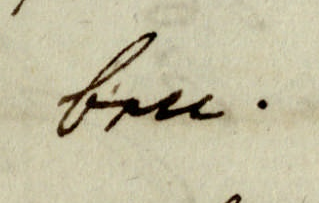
ben.
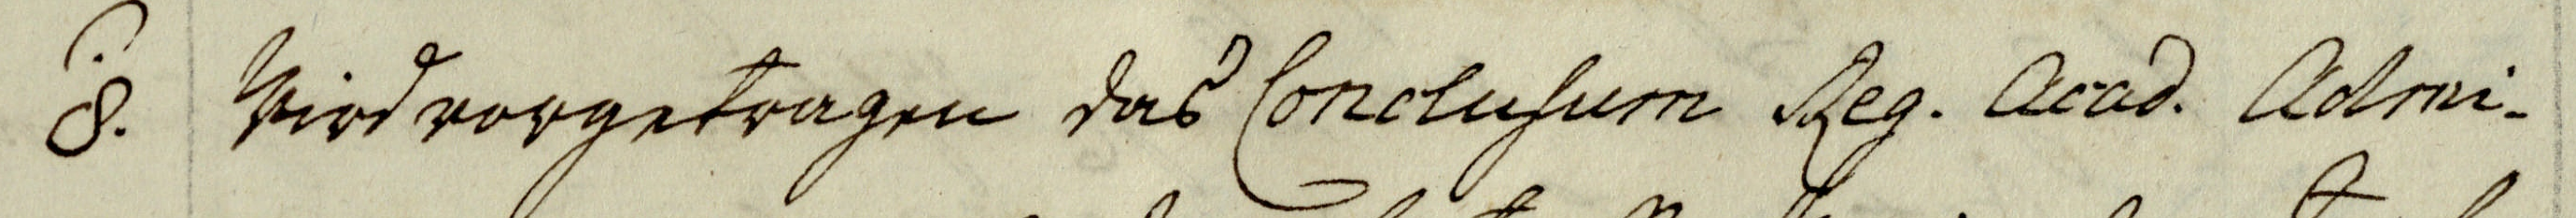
8. Wird vorgetragen das Conclusum Reg. Acad. Admi¬
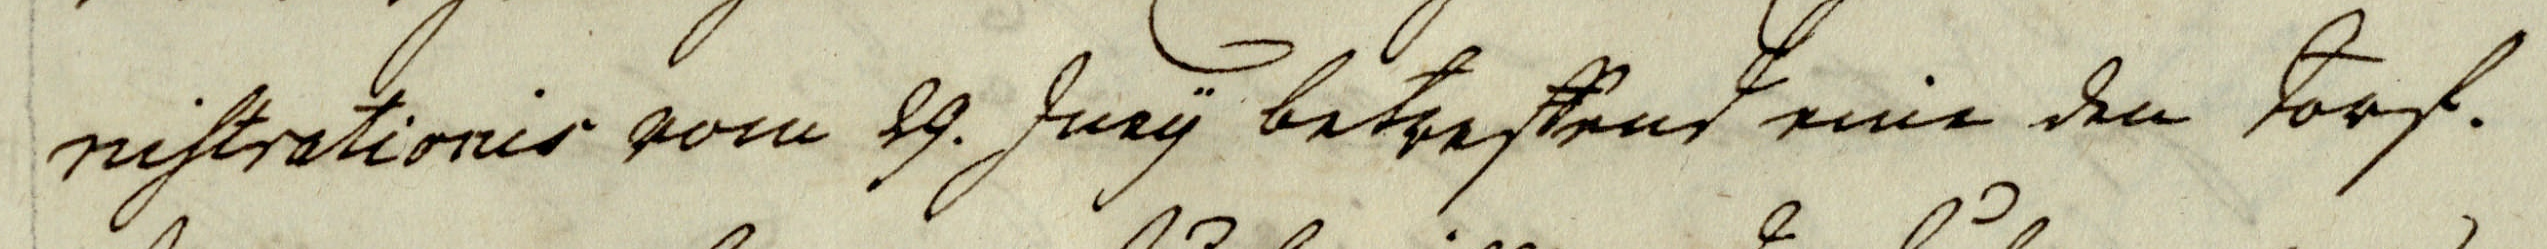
nistrationis vom 29. Junÿ betreffend eine den Torf¬
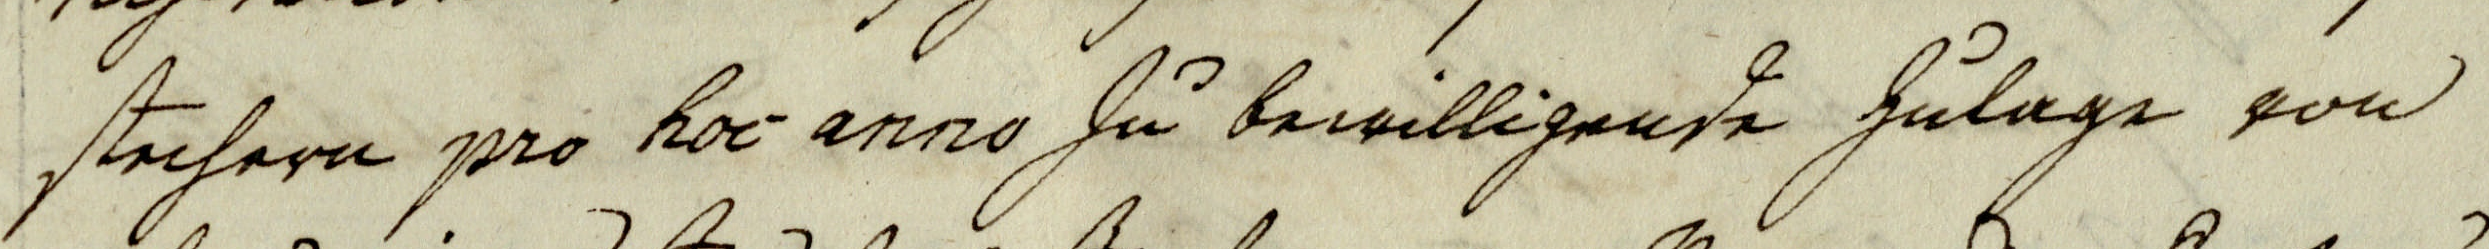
stechern pro hoc anno zu bewilligende Zulage von
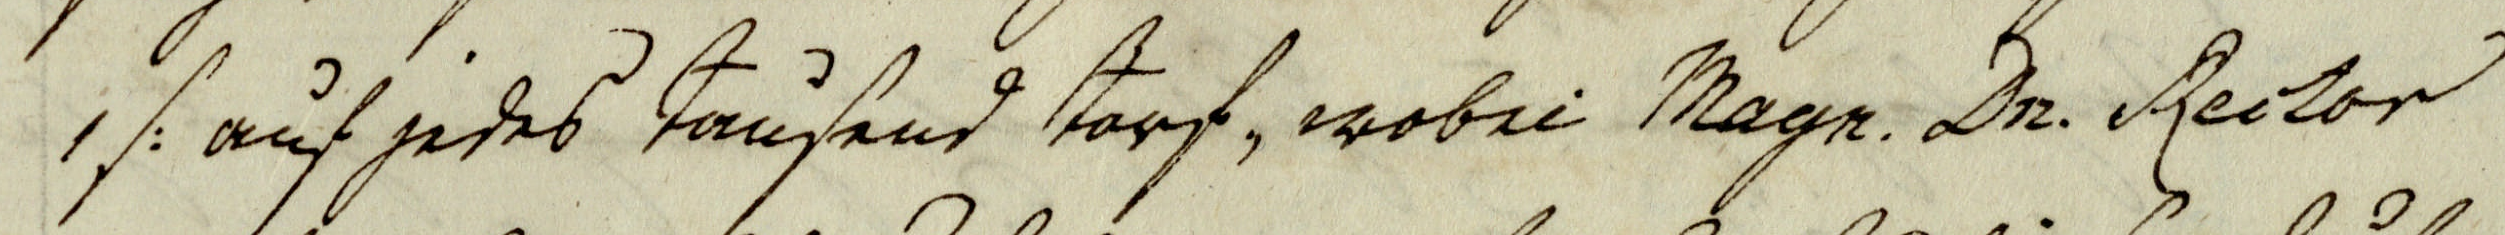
1 s: auf jedes Tausend Torf, wobei Magn. Dn. Rector
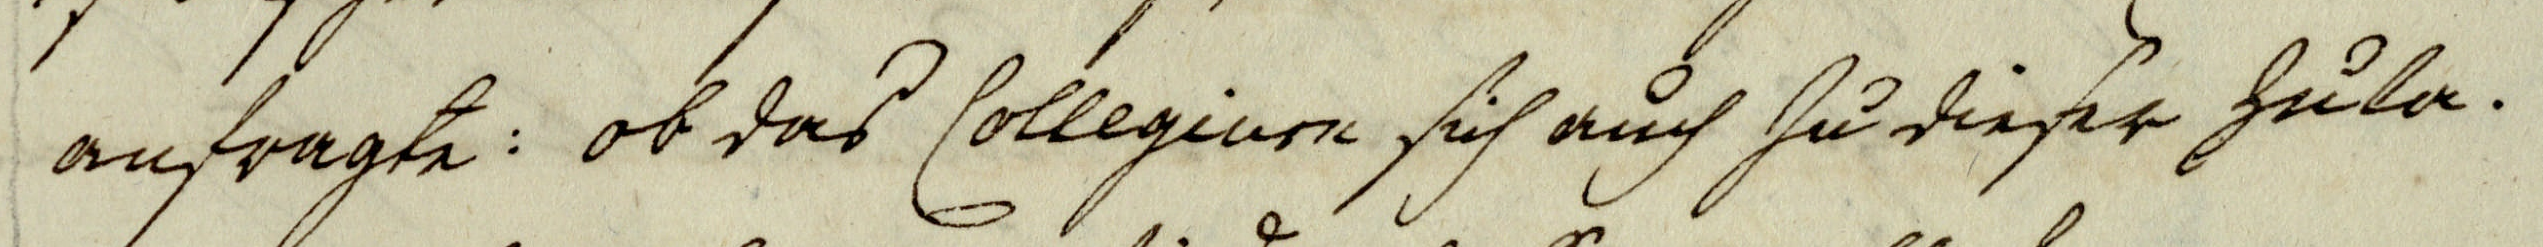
anfragte: ob das Collegium sich auch zu dieser Zula¬
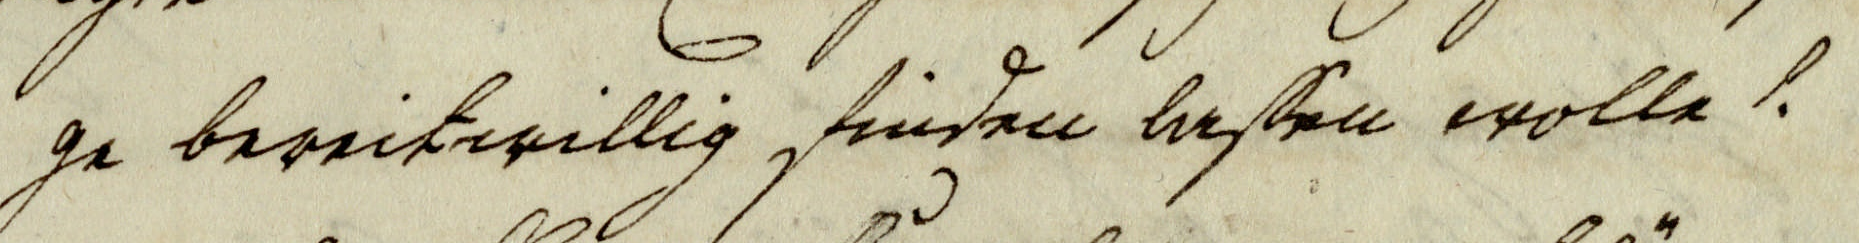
ge bereitwillig finden lassen wolle?
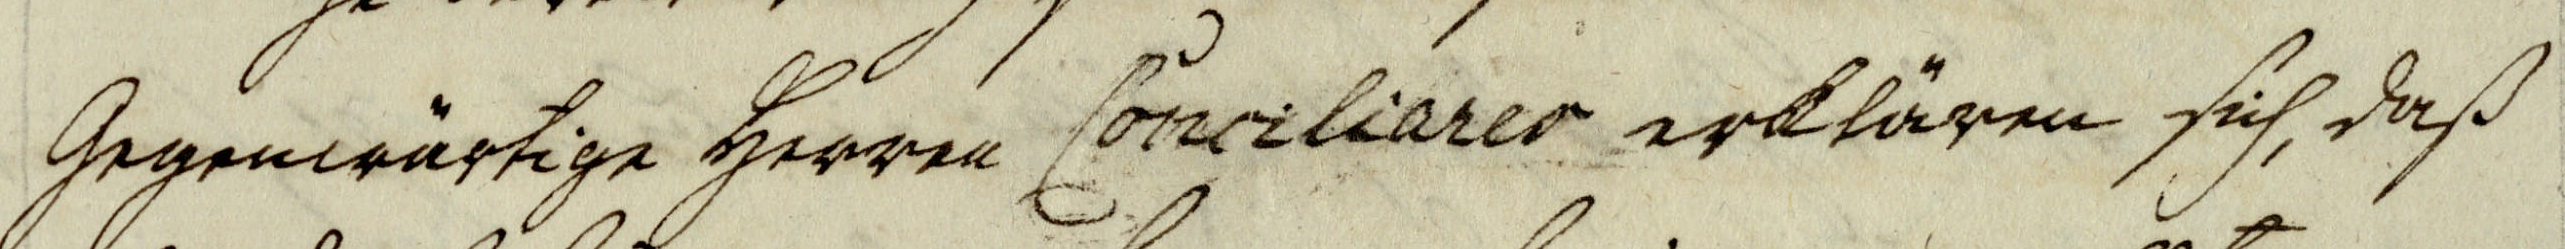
Gegenwärtige Herren Conciliares erklären sich, daß
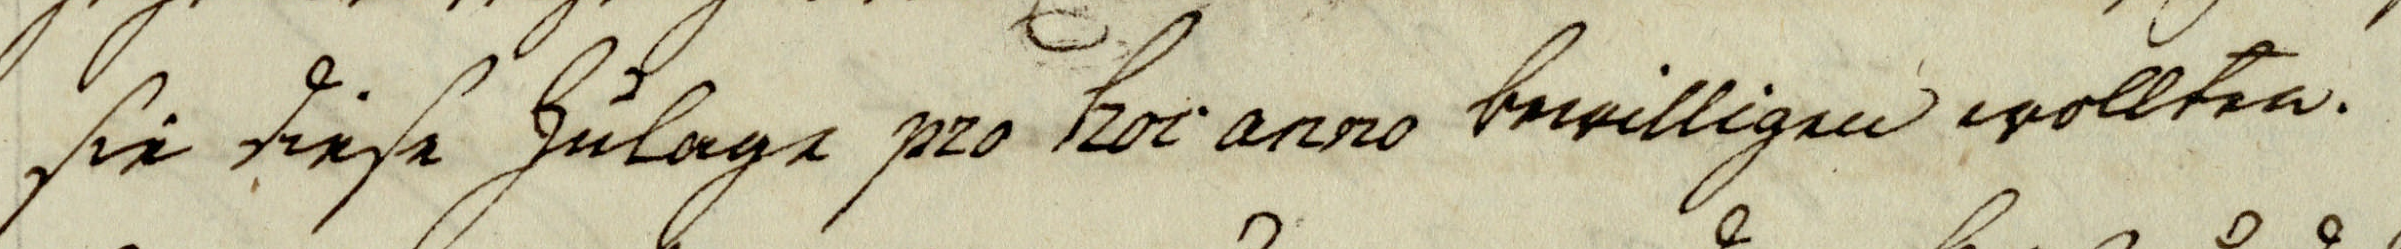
sie diese Zulage pro hoc anno bewilligen wollten.
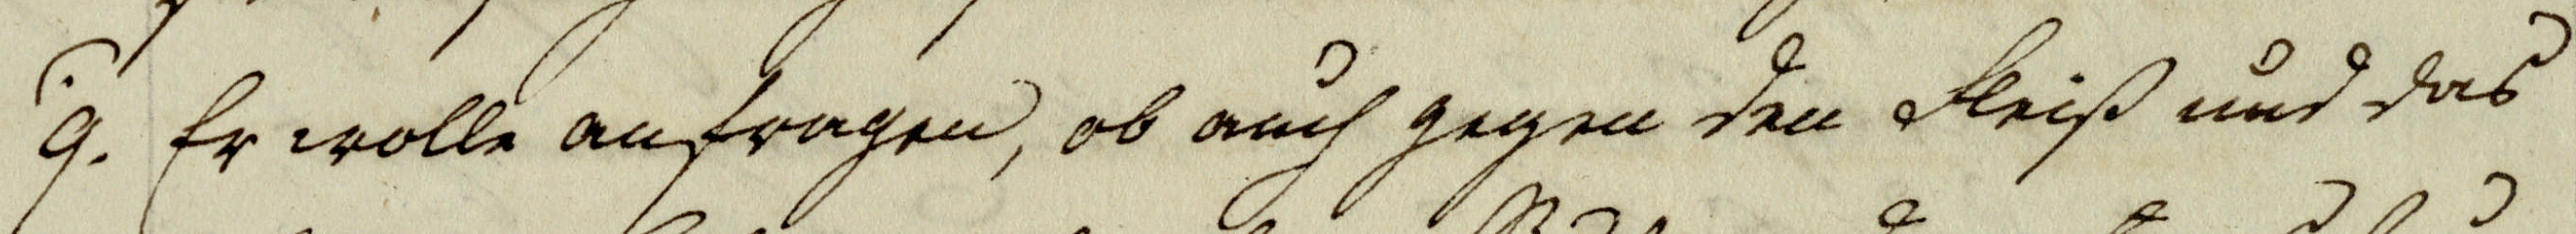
9. Er wolle anfragen, ob auch gegen den Fleiß und das
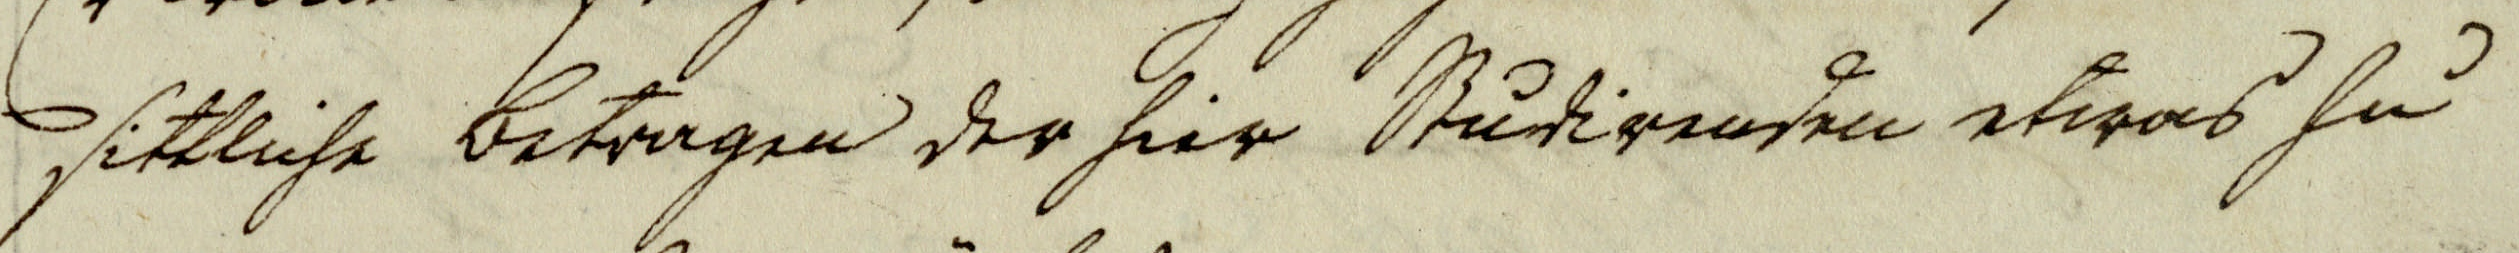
sittliche Betragen der hier Studirenden etwas zu
